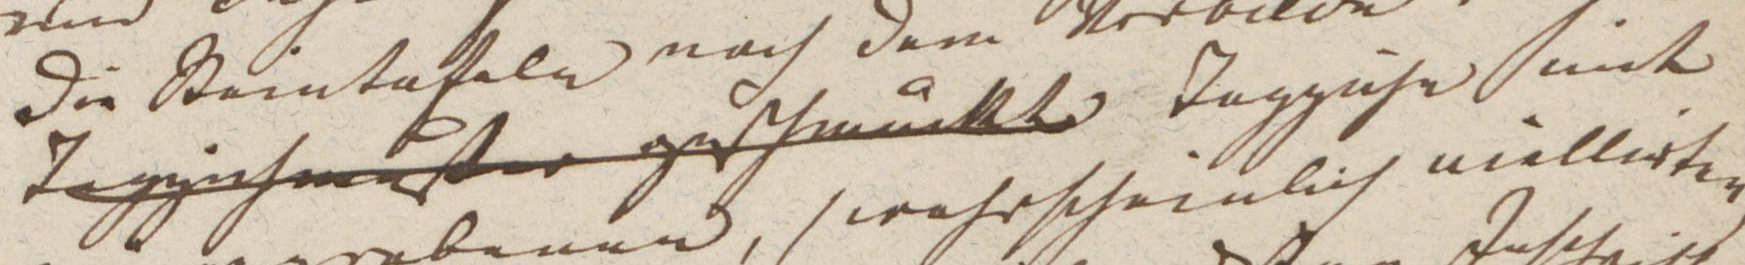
Teppichmuster geschmückt Teppiche mit
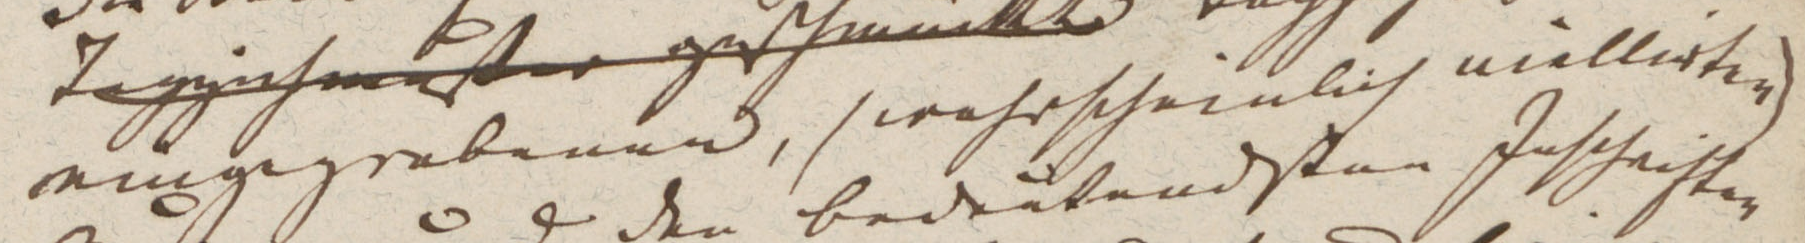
eingegrabenen, (wahrscheinlich niellirten)
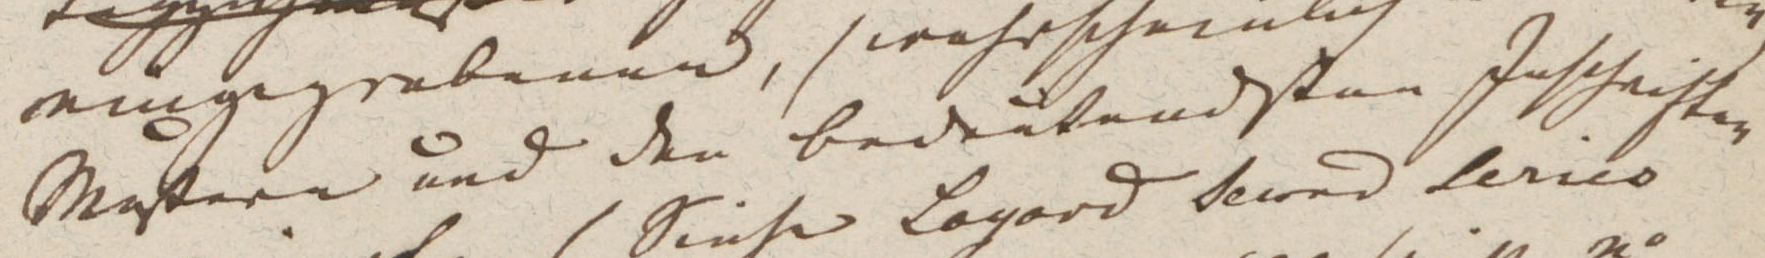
Mustern und den bedeutendesten Inschriften
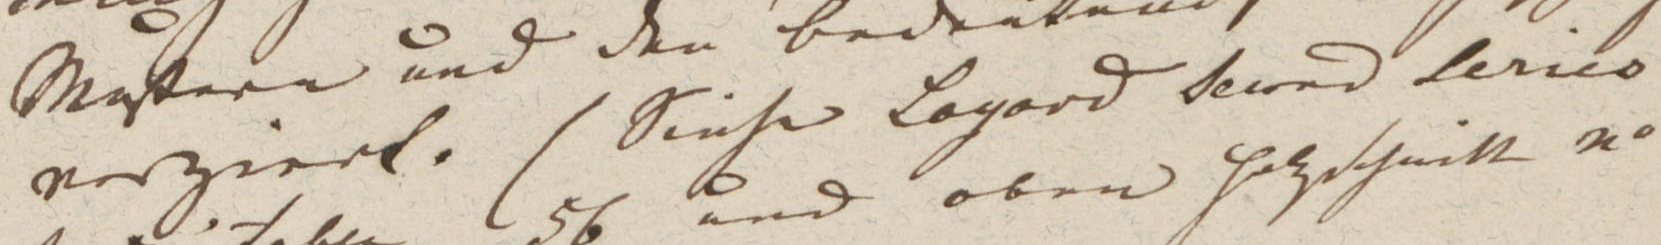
verziert. (Siehe Layard Second Series
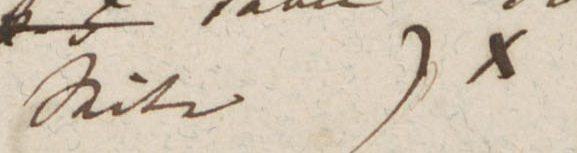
Seite )%
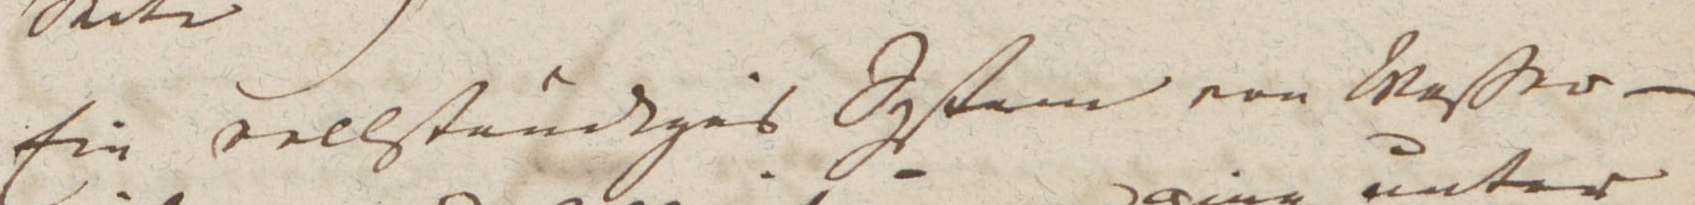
Ein vollständiges System von Wasser-
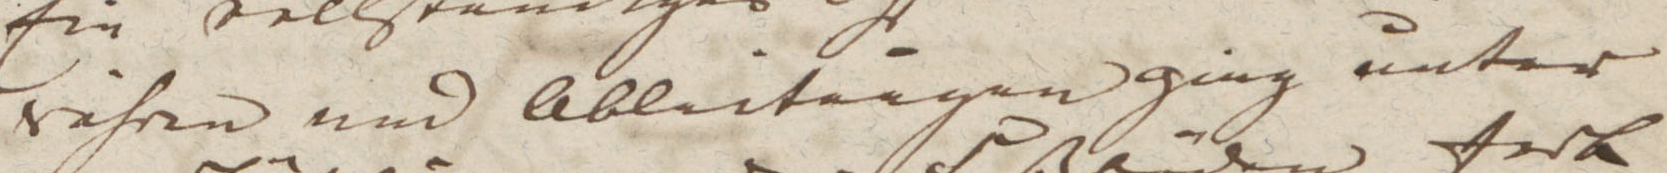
röhren und Ableitungen ging unter
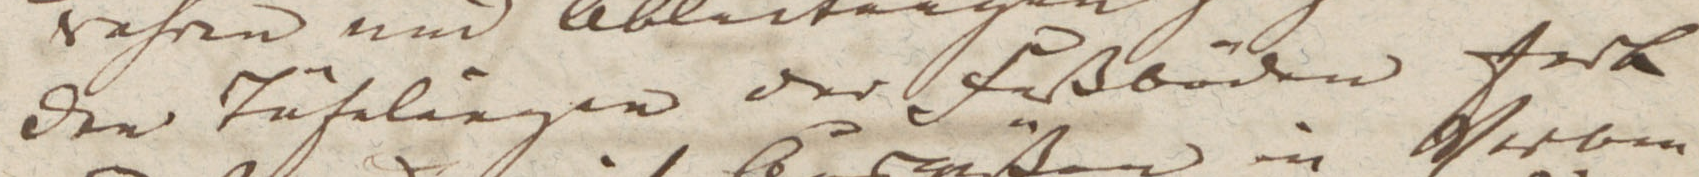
den Täfelungen der Fussböden fort
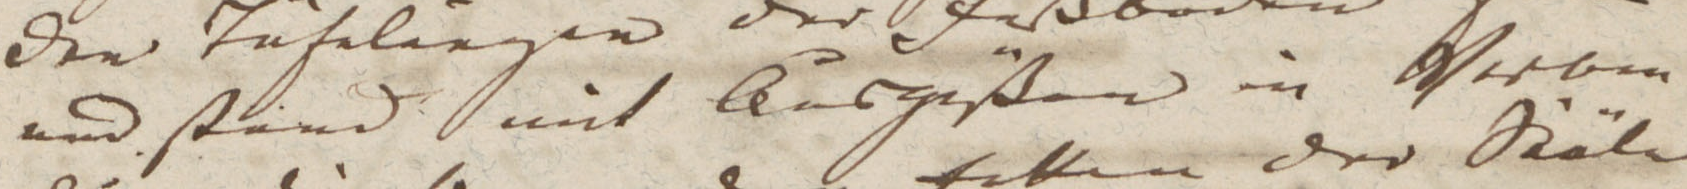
und stand mit Ausgüssen in Verbin-
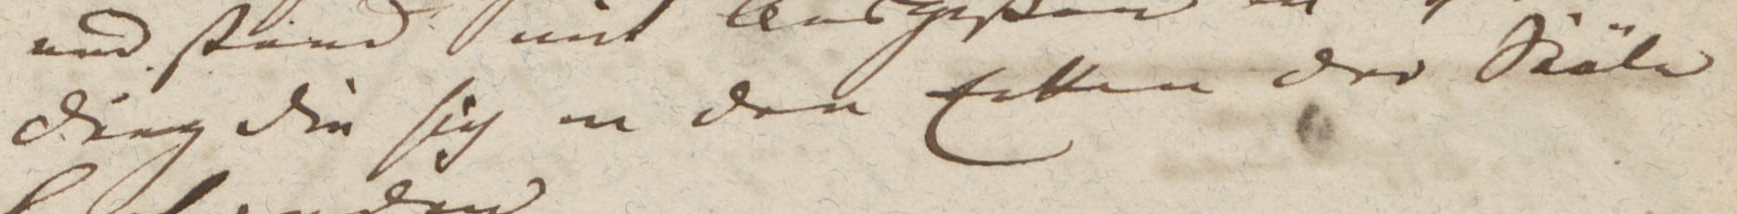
dung die sich in den Ecken der Sääle
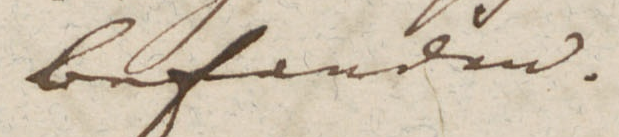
befanden.
